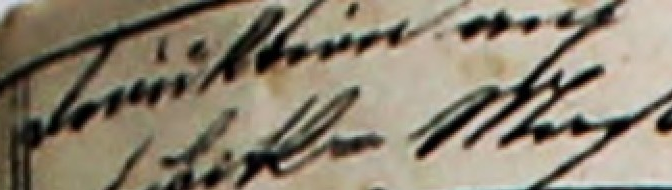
Reduktion auf
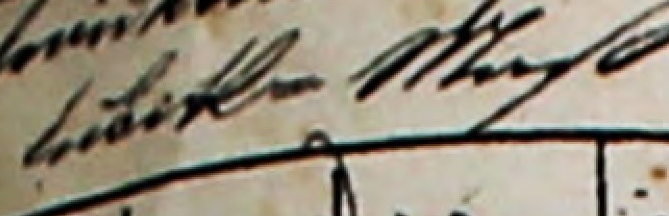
Cubik= Maß
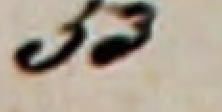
53
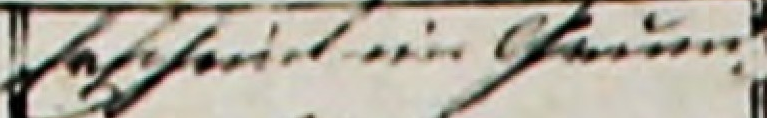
Erscheint im Grund„
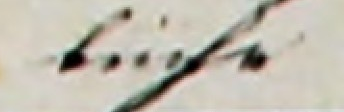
buche
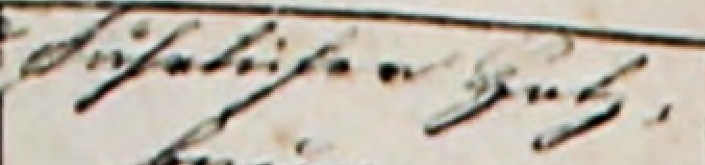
Jährlicher Holz„
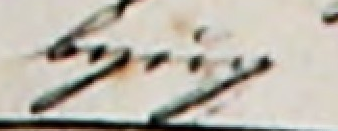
bezug
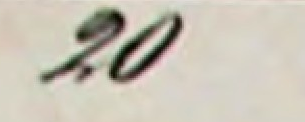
20
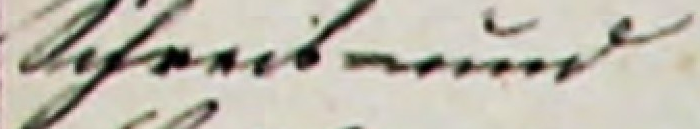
20
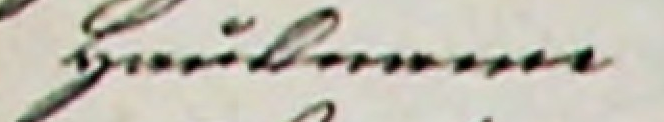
Schreib = und
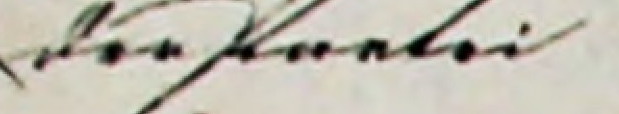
Hausmann der Partei
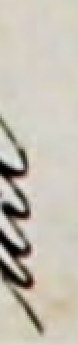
ad
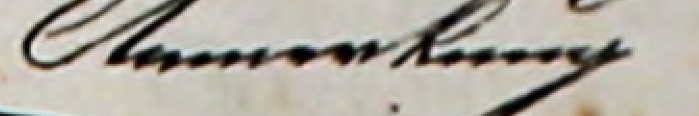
Anmenkung
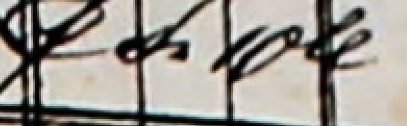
???
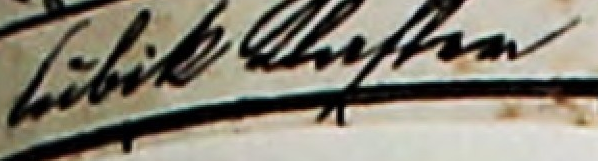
We Klafter
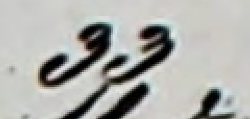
33
